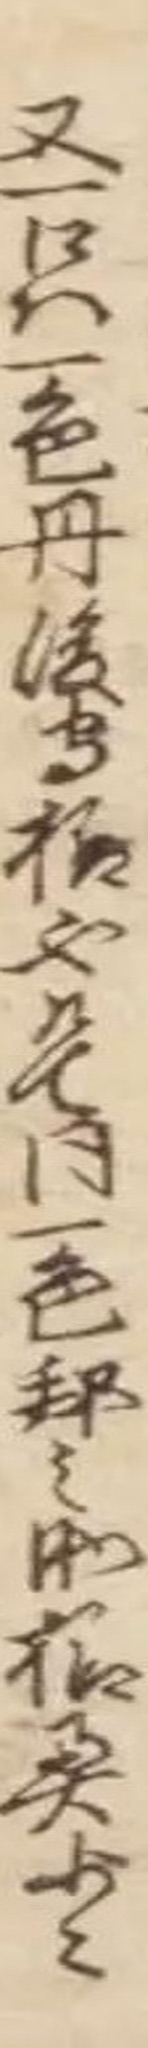又一口は一色丹後守様やけて同一色邦之助様奥少〃
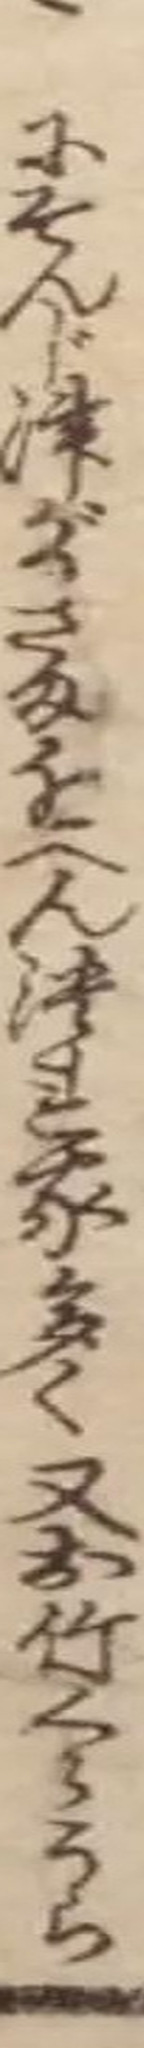にそんじ津がるさま近へん潰れ家多く又お竹くらうら
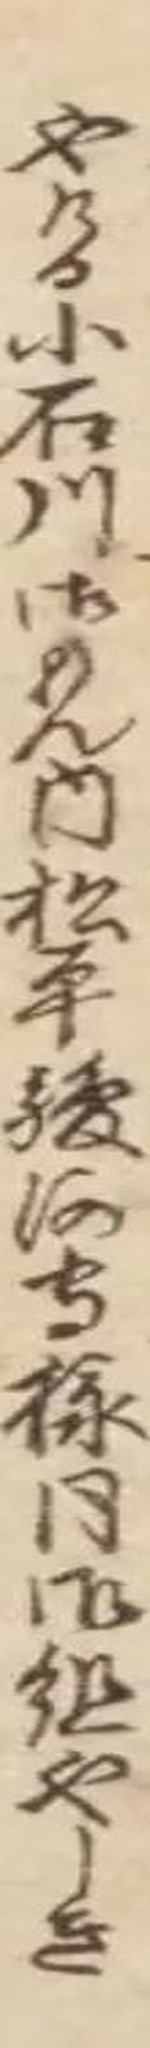やける小石川御もん内松平駿河守様同御組やしき
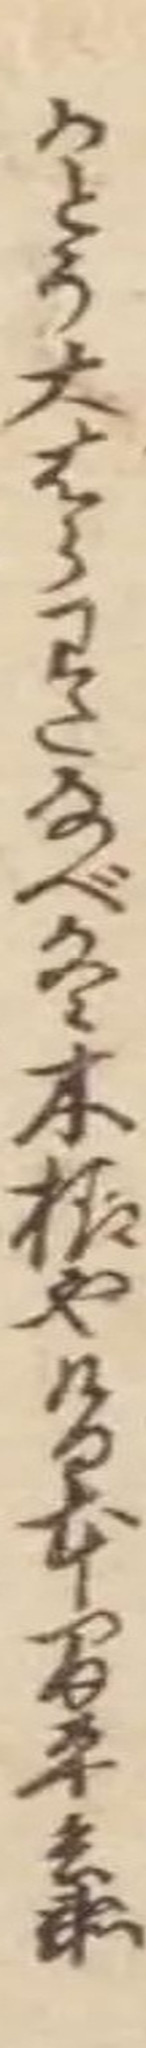かとう大はらわたなべ冬木様やける本間平兵衛
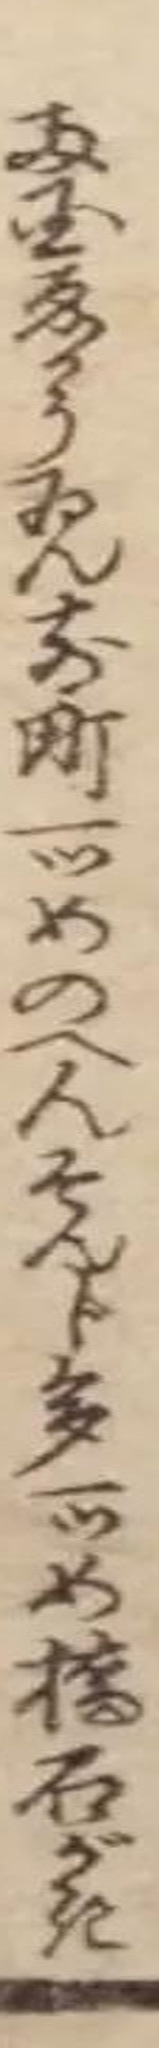両国ゑかうゐん前町一ツめのへんそんじ多一ツめ橋石がき
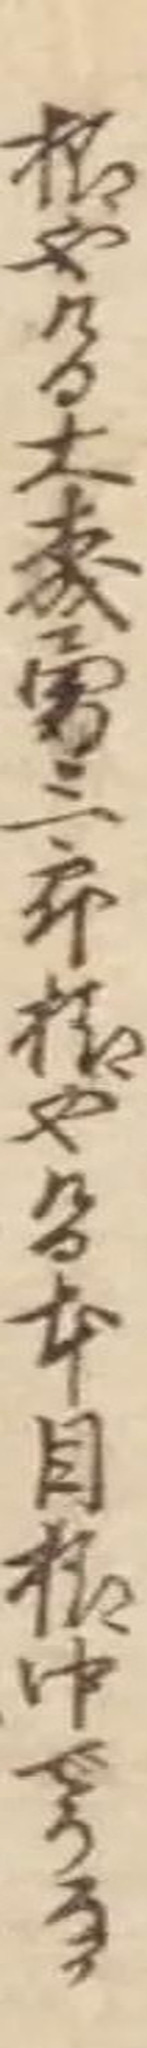様やける大森勇三郎様やける本目様中でうりう
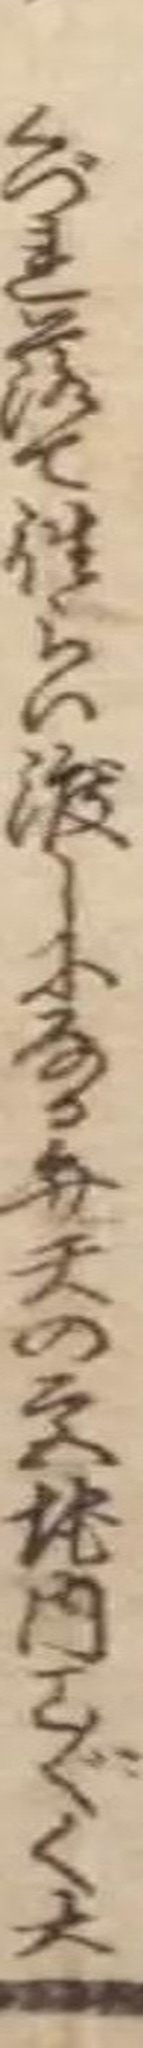くづれ落て往らい渡しになる弁天の宮地内こと〴〵く大
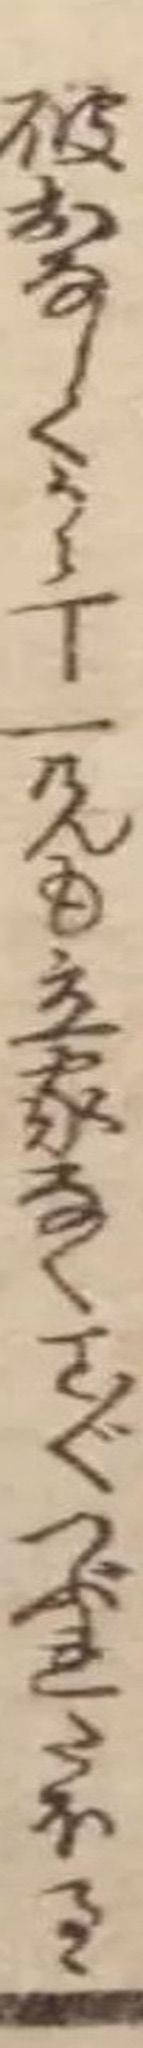破おなしくうら丁一けんも立家なくこと〴〵くつぶれたほるゝ
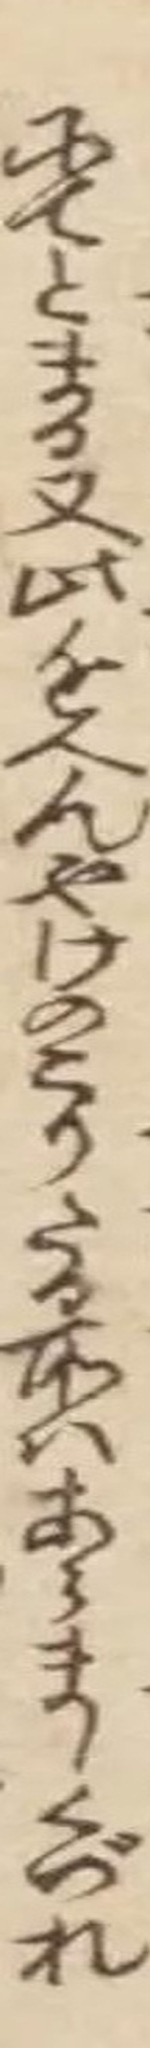にてとまる又此近へんやけのこりたる所はあらましくづれ
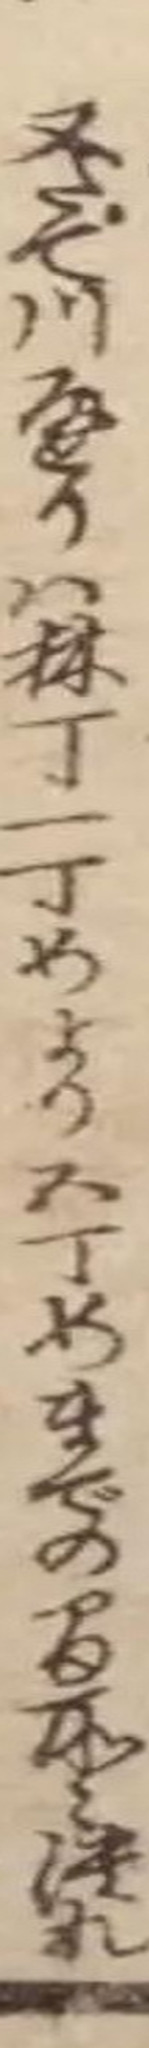又たて川通りは林丁一丁めより五丁めまでの間所々潰れ
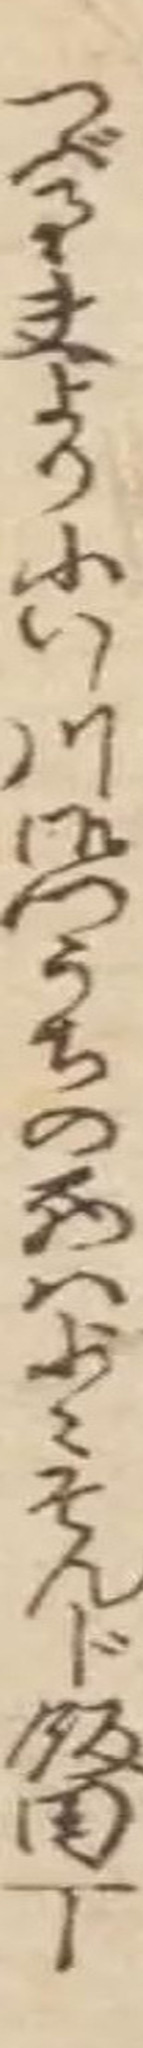つぶるゝ夫より小いし御門うちの所は少〃そんじ飯田丁
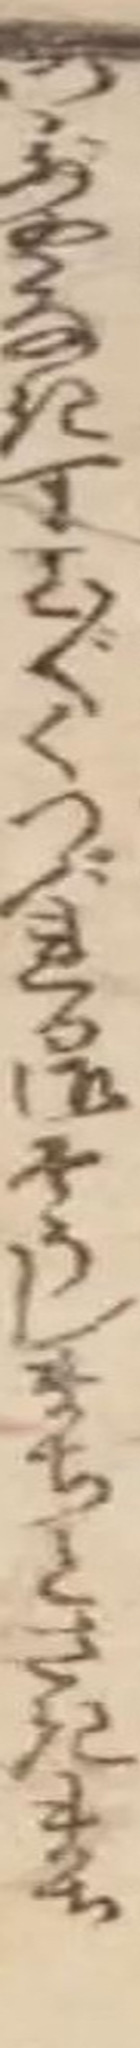門前やなき丁こと〴〵くつぶれる御そうしまちとさきまち
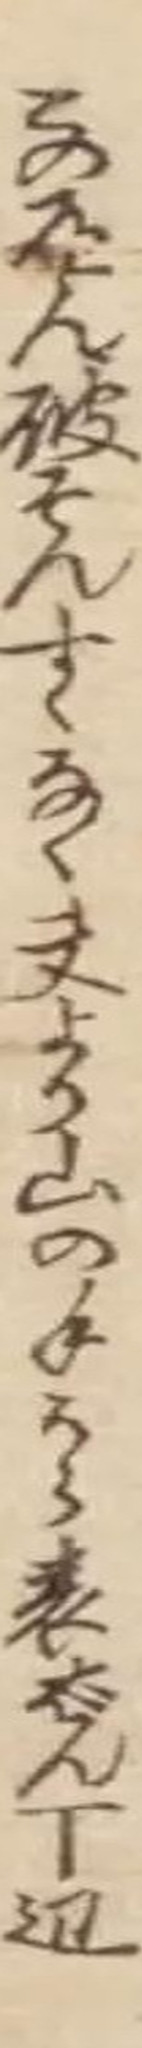このへん破そんすくなく夫より山の手うら表ばん丁辺
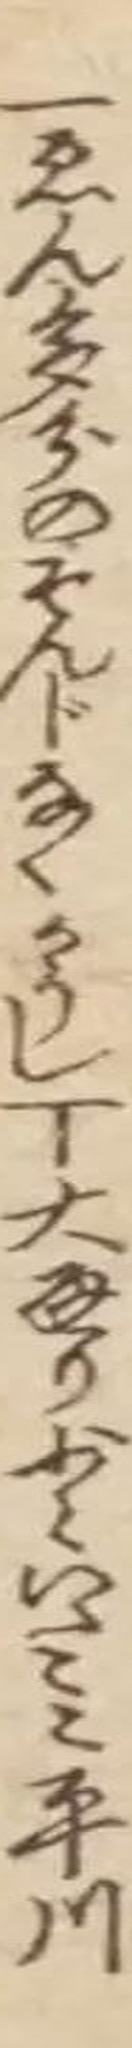一ゑん多分のそんじなくかうし丁大通り少〃いたみ平川
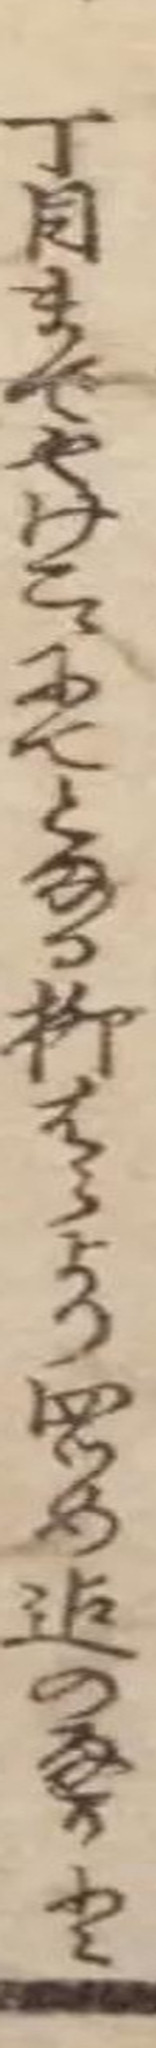丁目までやけこゝにてとまる柳はらより四ツめ迄の通り少々
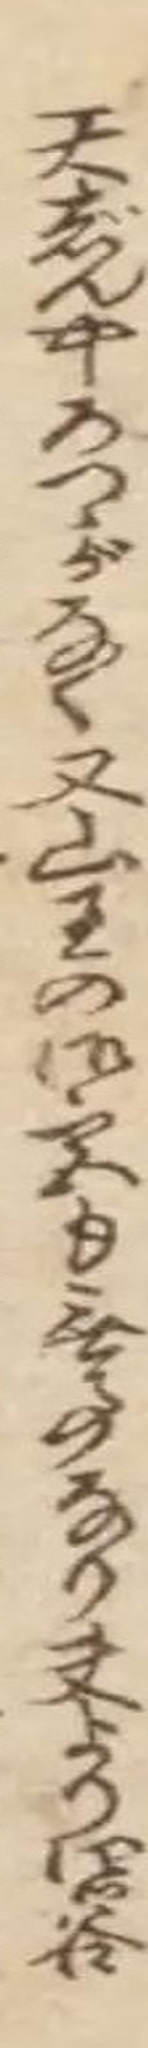天じん中ろつゝがなく又山王の御宮も無事なり夫より黒谷
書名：関東大地震末代鑑
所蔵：国立国会図書館 National Diet Library, JAPAN
